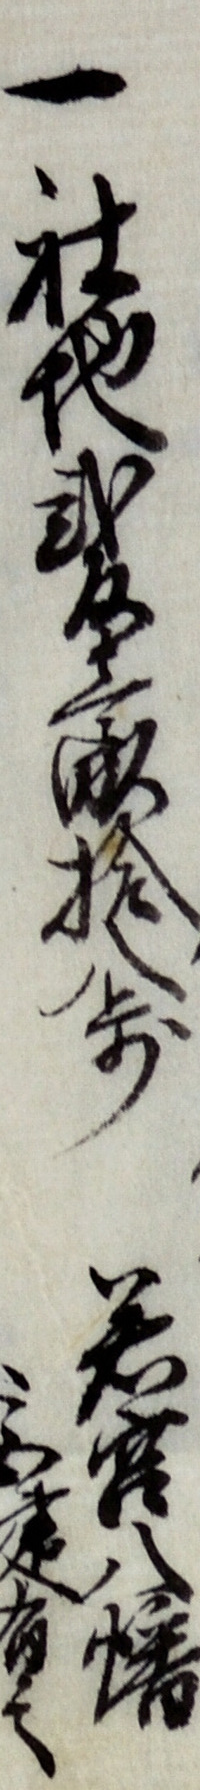一社地弐反壱畝拾八歩若宮八幡
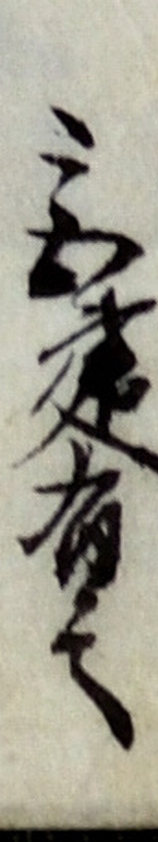宮建有之
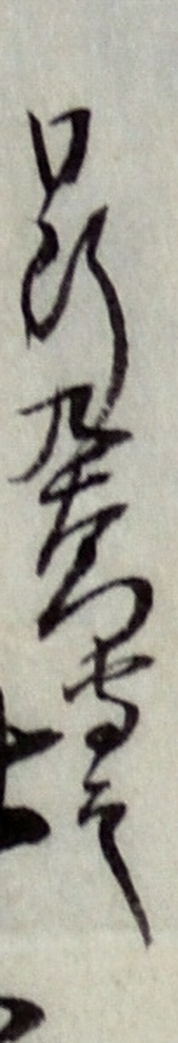同所九左衛門守之
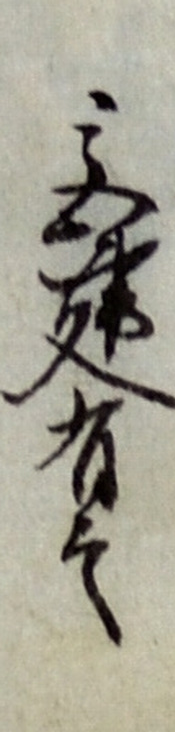宮建有之

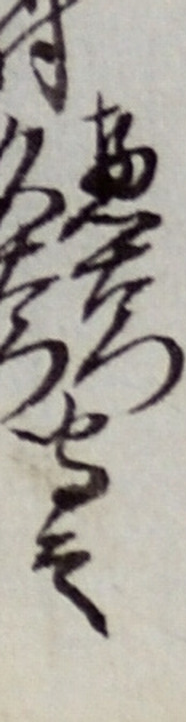忠右衛門守之
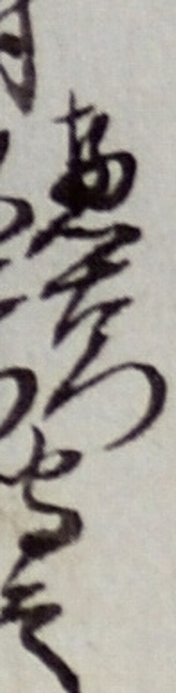忠右衛門守之
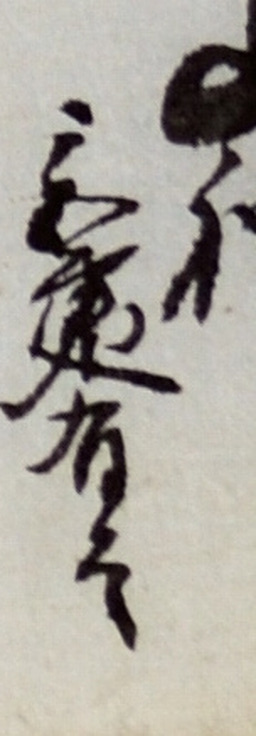宮建有之
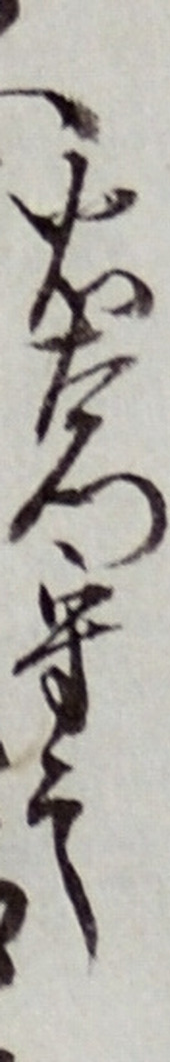忠右衛門守之
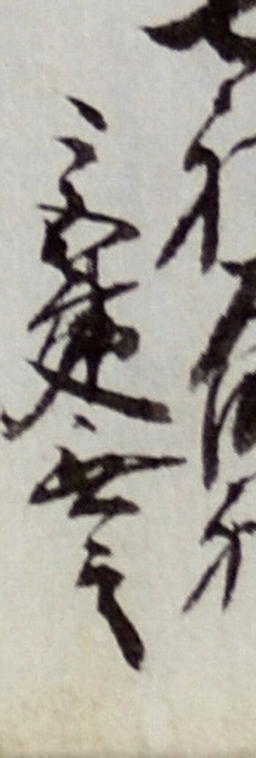宮建無之
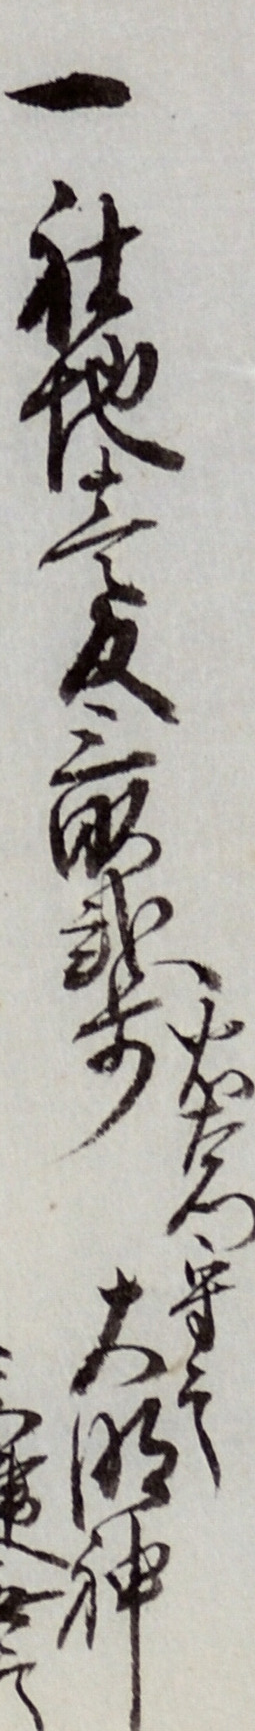一社地壱反三畝弐歩大明神
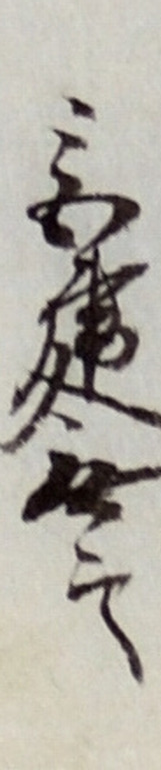宮建無之
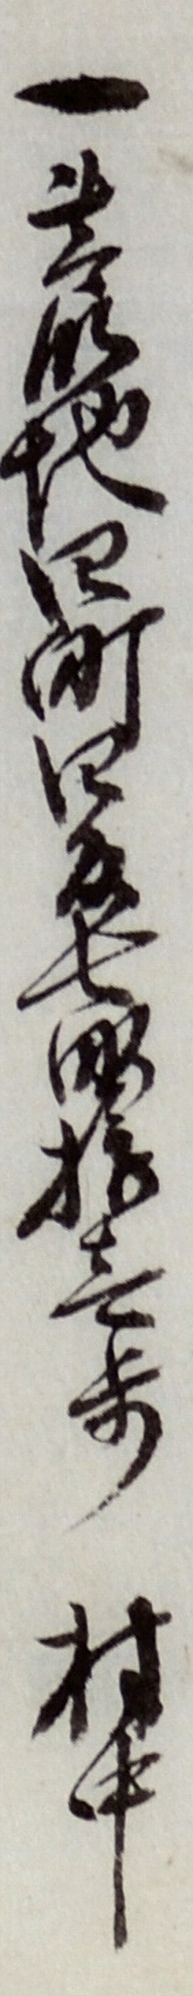一荒地四町四反七畝拾壱歩村中
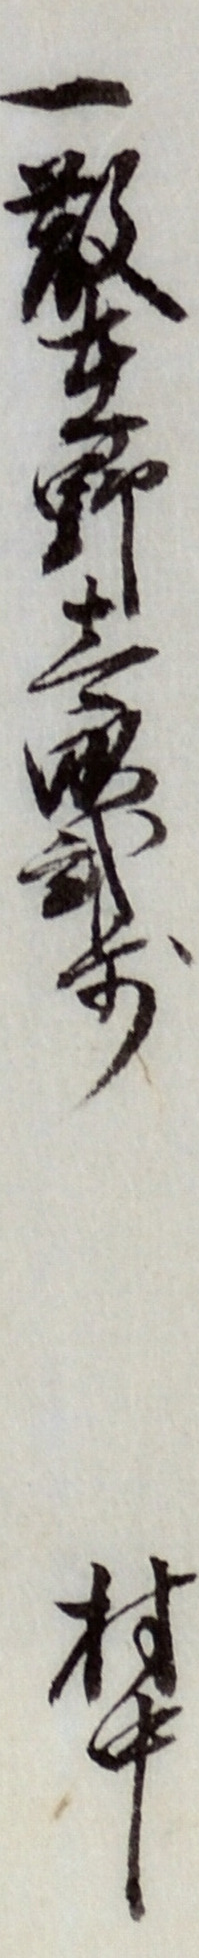一散在野壱畝弐歩村中
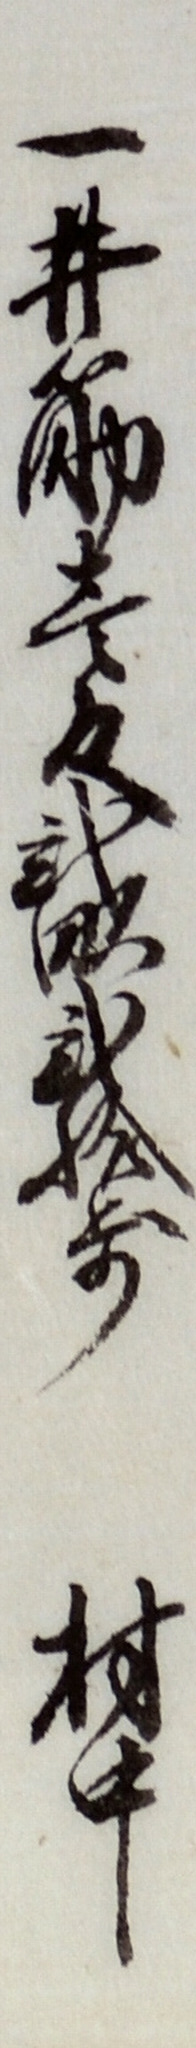一井筋壱反弐畝弐拾歩村中
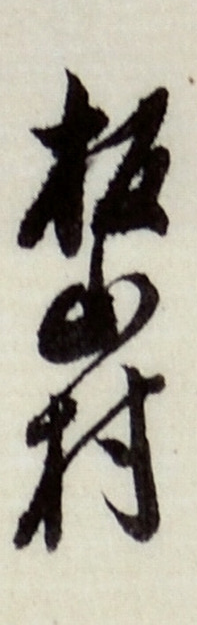板山村
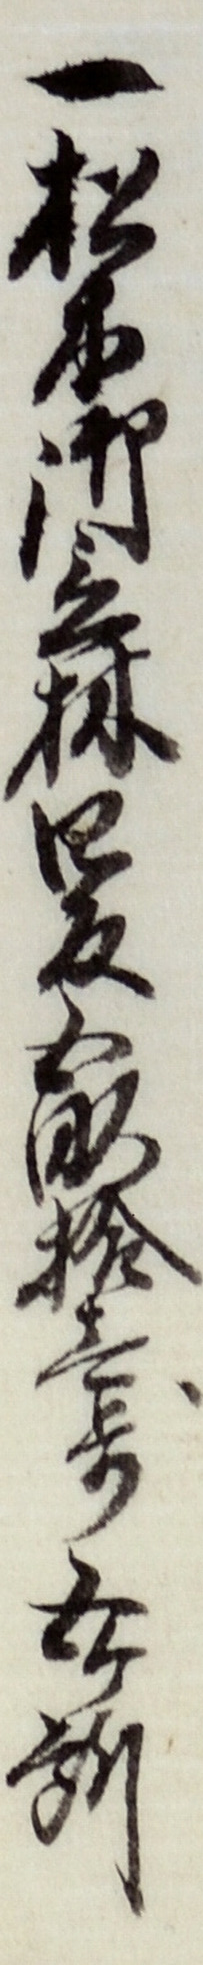一松木御立林四反五畝拾壱歩五ヶ所
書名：御領分中山林社地手控
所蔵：伊那市立高遠町図書館・合同会社AMANE
